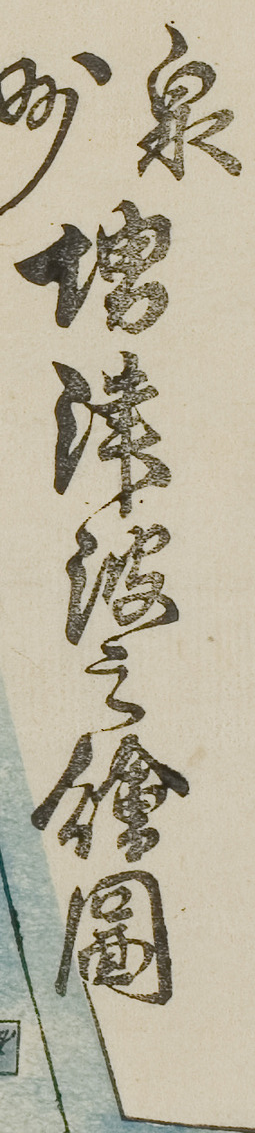泉州堺津波之絵図
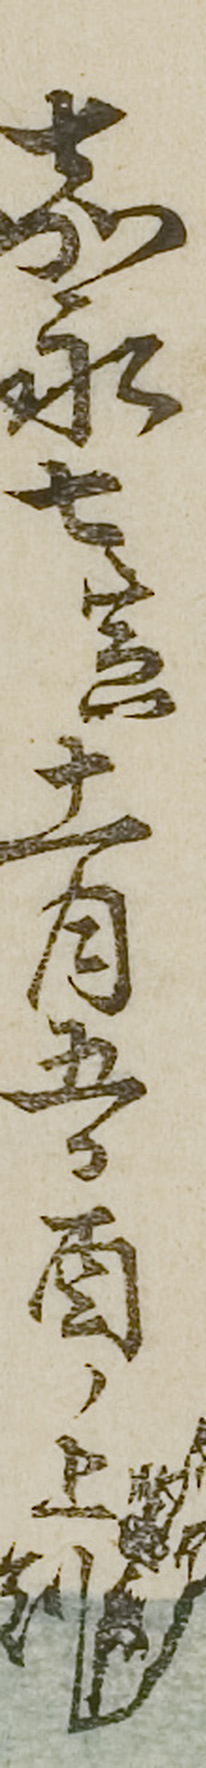嘉永七寅十一月五日酉の上刻
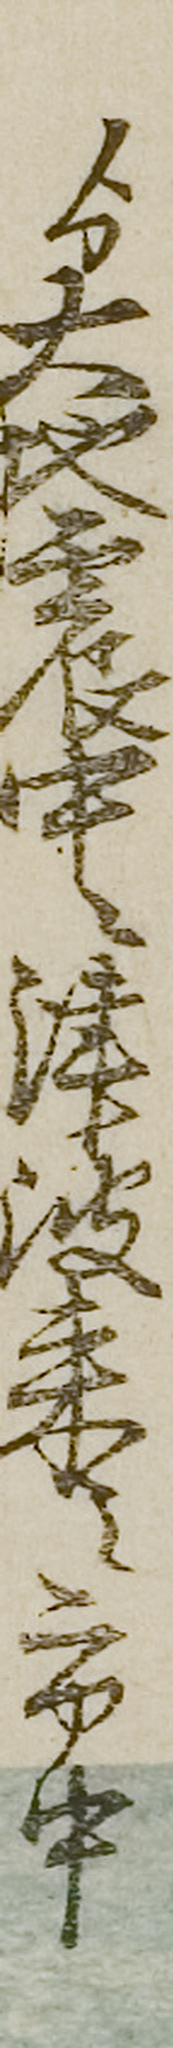ゟ大地震中ニ津波来て市中
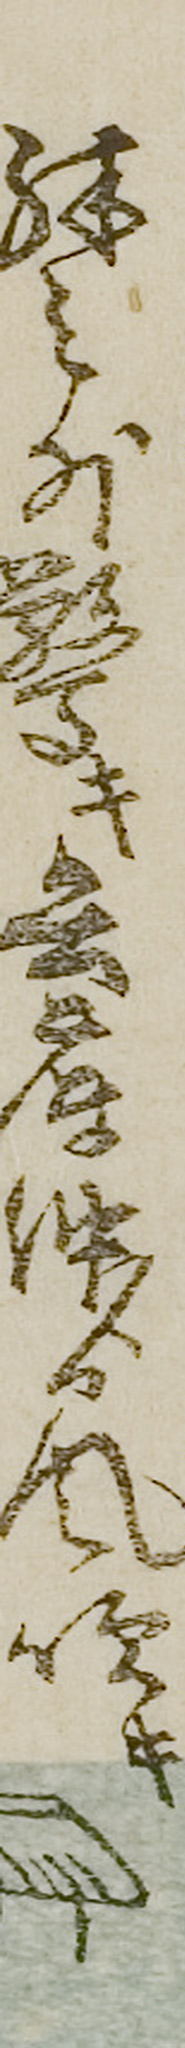殊の外驚き兵庫沖ゟ風吹き
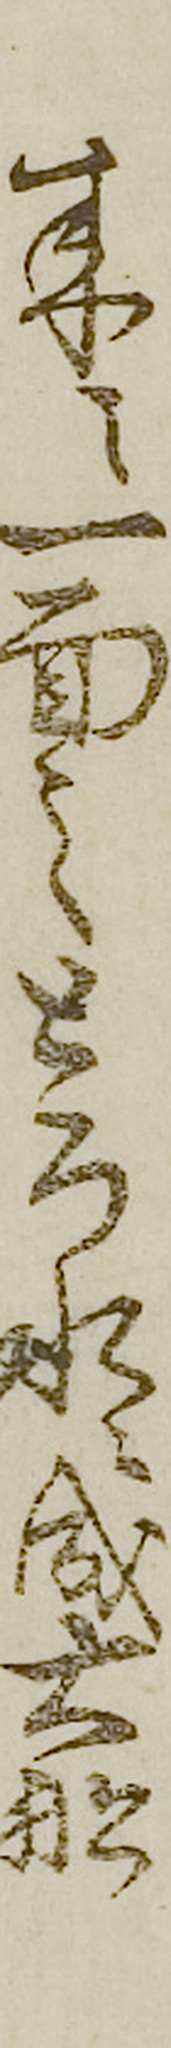来て一面のとろ水に成大船
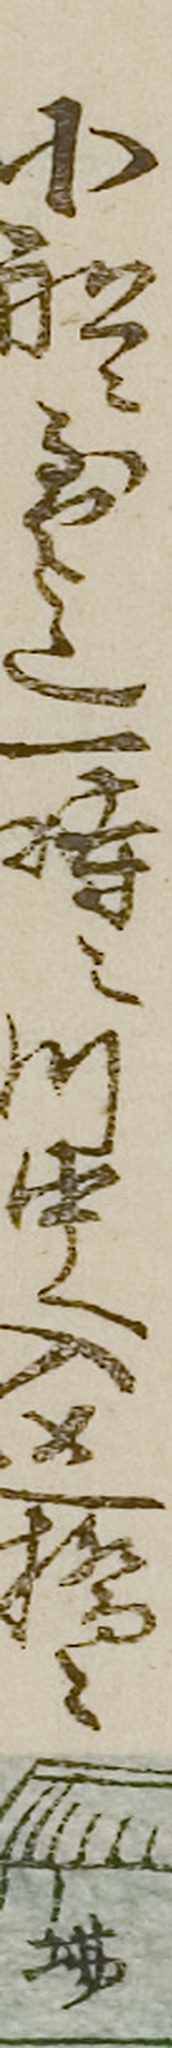小船に至迄一時に川中へ入込橋々
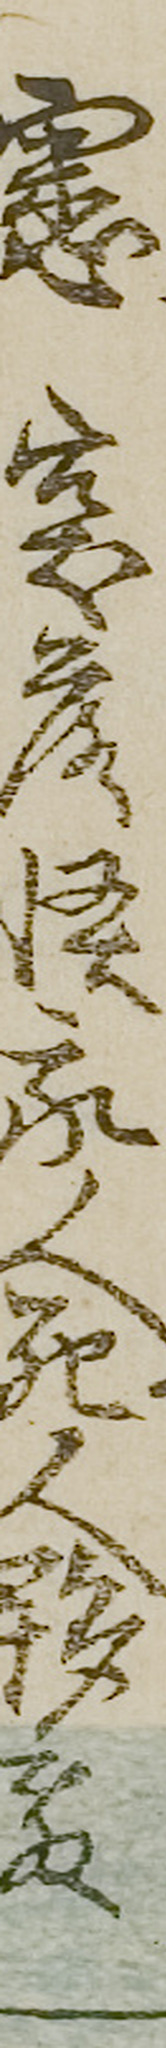悉突落怪我人死人夥敷
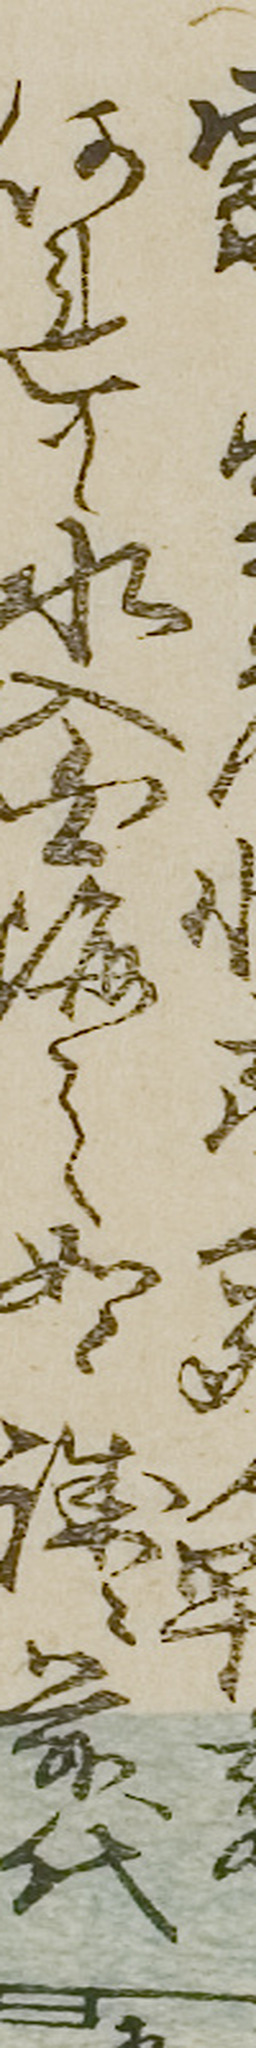何れも水入白海の如く誠に前代
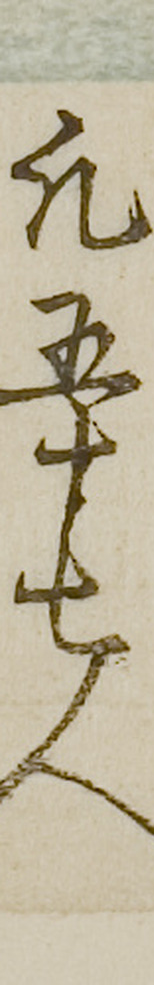凡五十七人
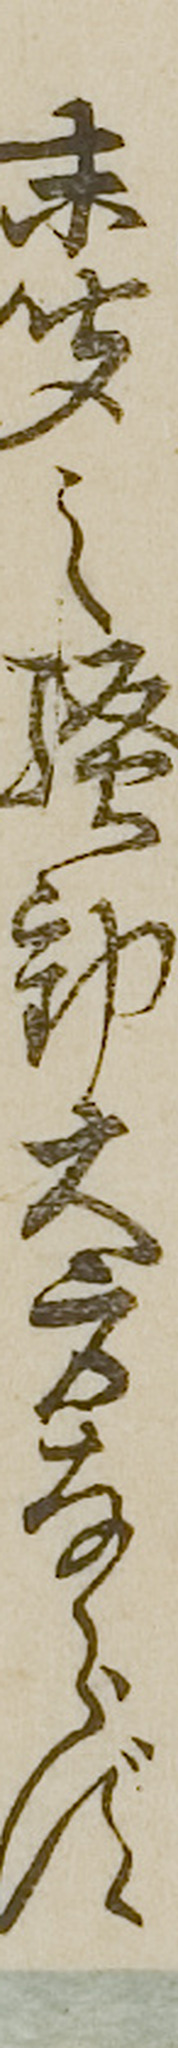未聞の騒動大方ならず
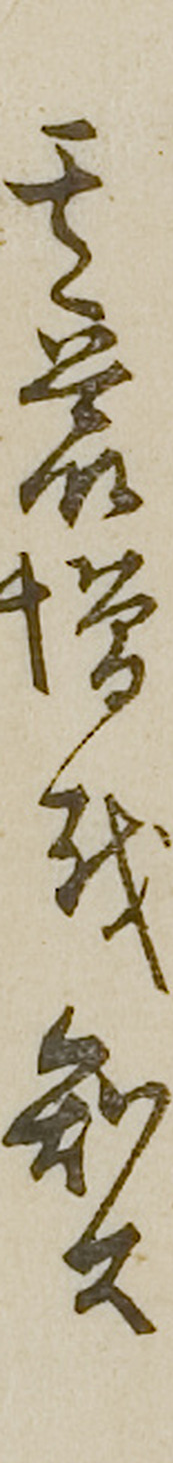其荒増を知す
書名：泉州堺津波之絵図
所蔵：東京大学総合図書館 General Library in the University of Tokyo, JAPAN
